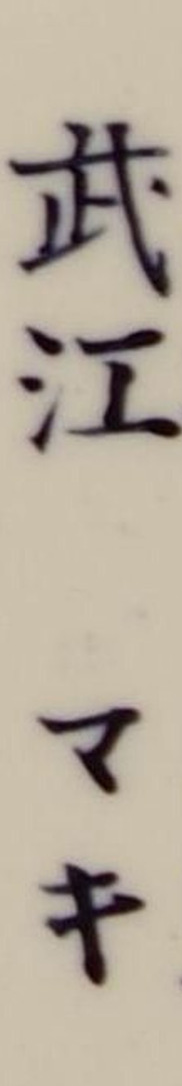武江マキ
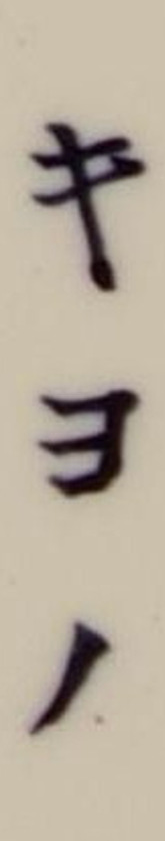キヨノ
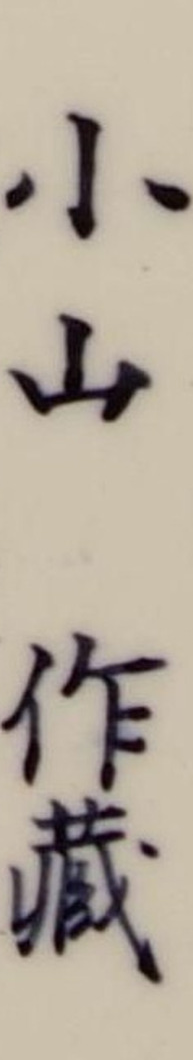小山作蔵
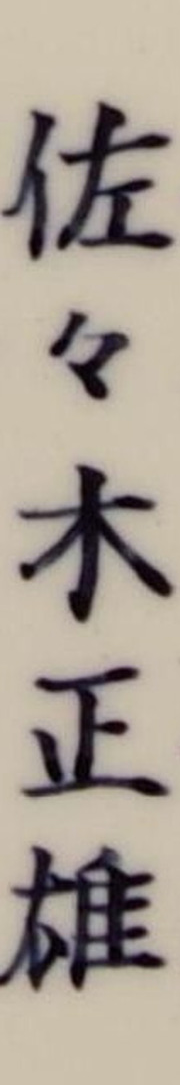佐々木正雄
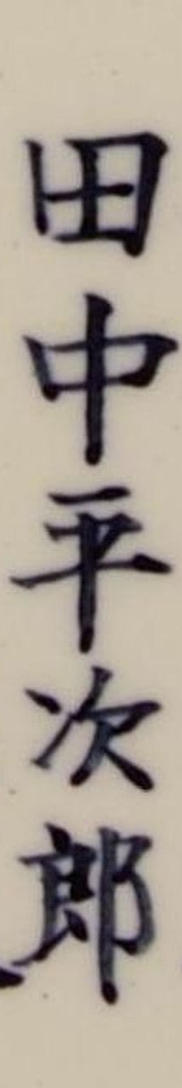田中平次郎
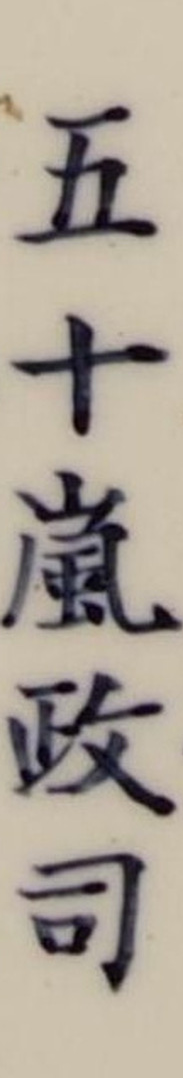五十嵐政司
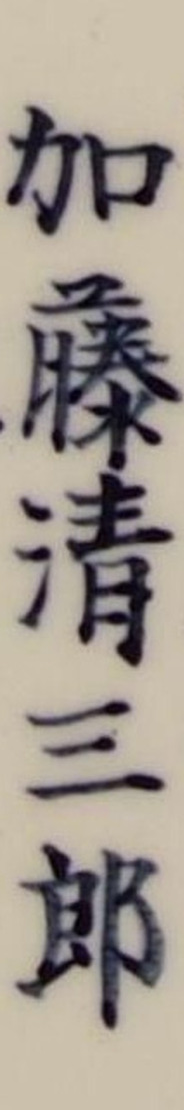加藤清三郎
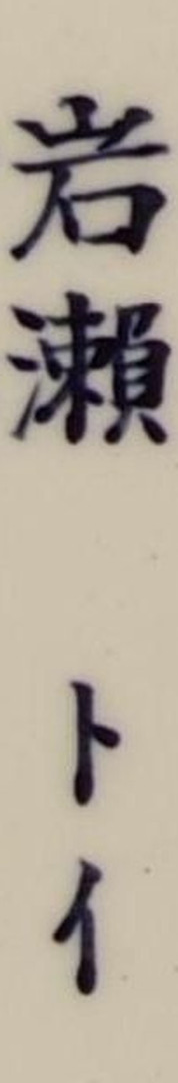岩瀬トイ
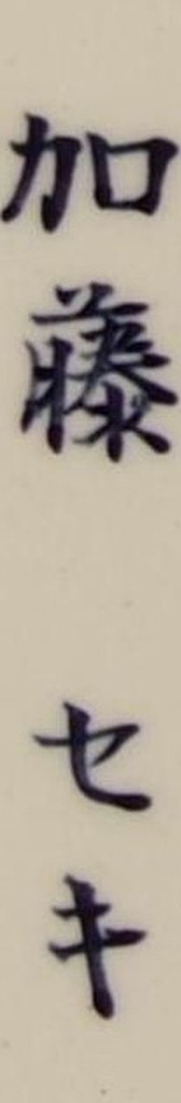加藤セキ
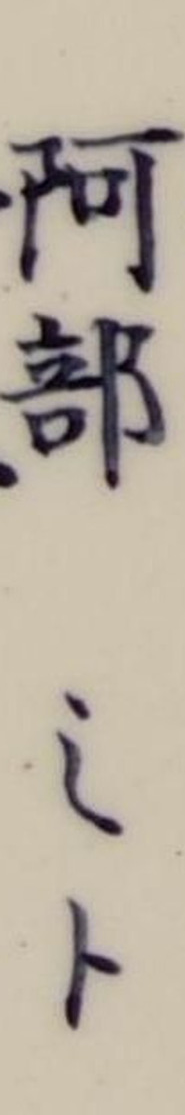阿部ミト
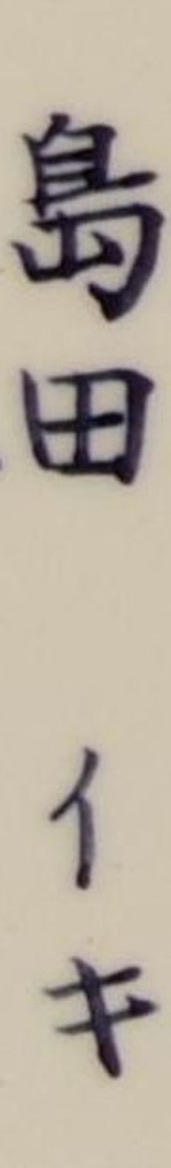島田イキ
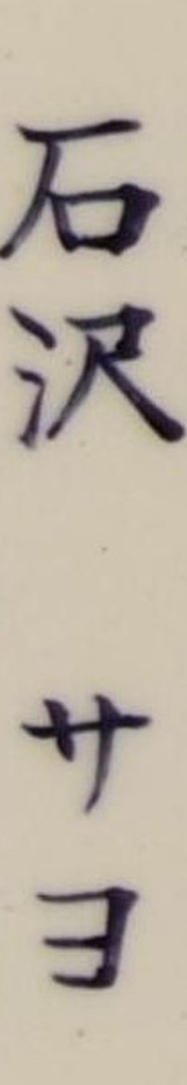石沢サヨ
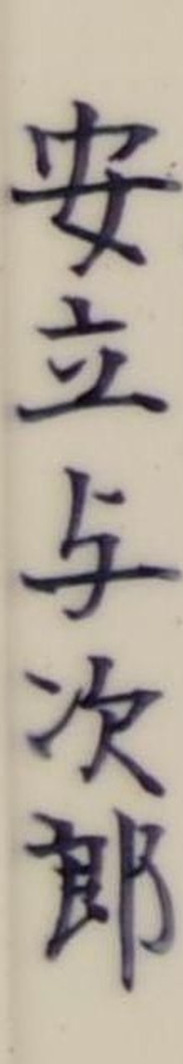安立与次郎

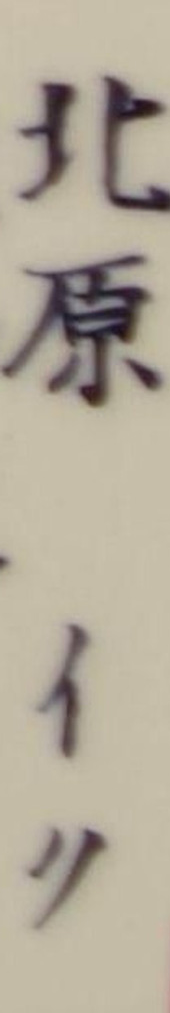北原イク
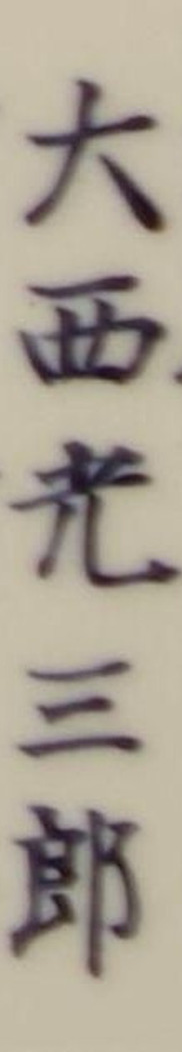大西光三郎
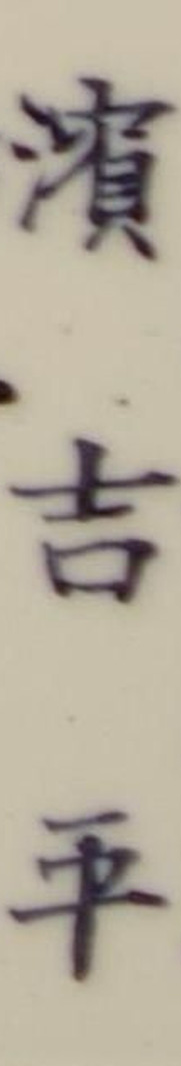浜吉平
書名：M~S
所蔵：高野山金剛峯寺
